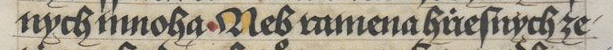nych mnoha.Neb ramena hṙíeẛnych ze¬
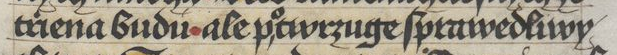tṙiena budú.ale potwrzuge ſprawedliwy¬
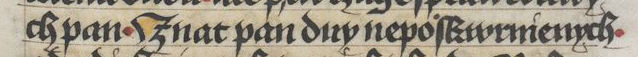ch pan.Znat pan duy nepoẛkwrnienych.
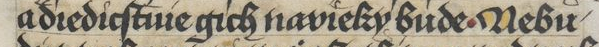a diedicſtuíe gich navieky bude.Nebu¬
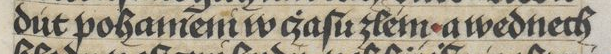dút pohaníeni w cżaſu zlém.a wednech
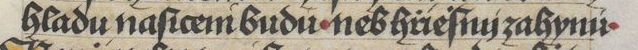hladu naſiceni budu.neb hṙíeẛnij zahynú.
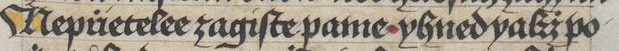Nepṙíetelee zagiſte panie.yhnedyakż po¬
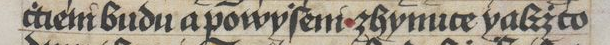ċtieni budu a powyẛeni.zhynuce yakŻ to
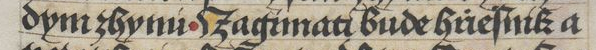dym zhynú.Zagimati bude hṙieẛník a
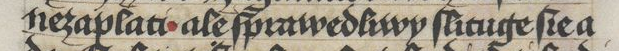nezaplatí.ale ſprawedliwy ſlituge ſie a
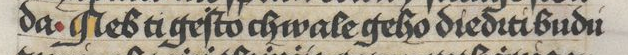da.Nieb ti geẛto chwale geho diediti budú
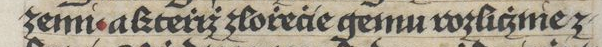zemí.a kteṙíż zloṙeċíe gemu rozlicżnie z¬
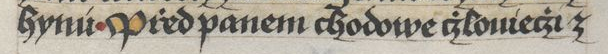hynú.Pṙed panem chodowe cżlouíecżí z¬
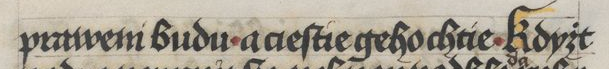praweni budu.a cieſtie geho chtíe.Kdyżt
